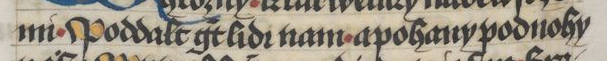mi.Poddalt ḡt lidi nam.a pohany pod nohy
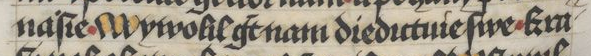naẛie.Wywolil ḡt nam diedictuie ſwe.kra¬
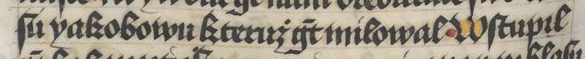ſu yakobowu kteruž ḡt milowal.Wſtupil
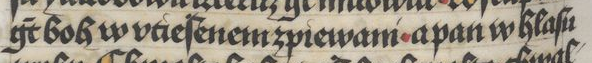ḡt boh w vtieẛenem zpiewaní.a pan w hlaſu
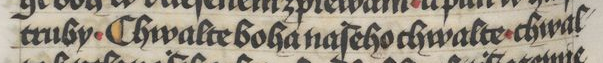truby.Chwalte boha naẛeho chwalte.chwal¬
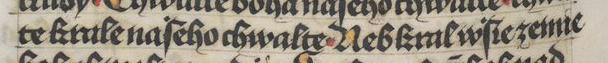te krale naẛeho chwalte.Neb kral wẛie zemie
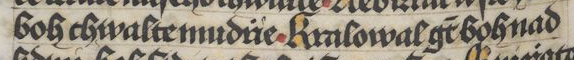boh chwalte mudṙie.Kralowal ḡt boh nad
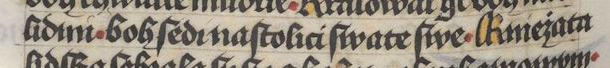lidmi.boh ſedi naſtolici ſwate ſwe.Kníeżata
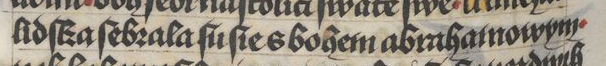lidſka ſebrala ſu ſie s bohem abrahamowym.
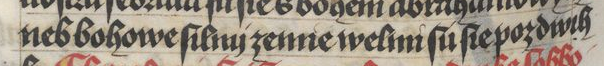neb bohowe ſilnij zemie welmi ſu ſie pozdwih¬
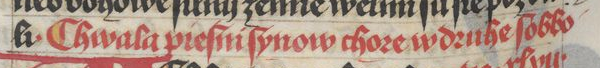li.Chwala pieſni ſynow chore w druge ſobbo¬
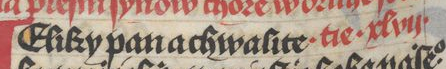Eliky pan a chwalte.tie. xlvij.
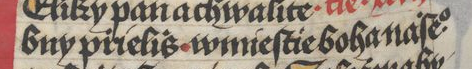bny pṙieliš.wmieſtie boha naẛe°.
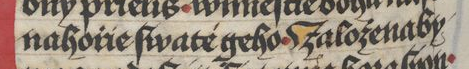nahořie ſwaté geho.Založena by¬
